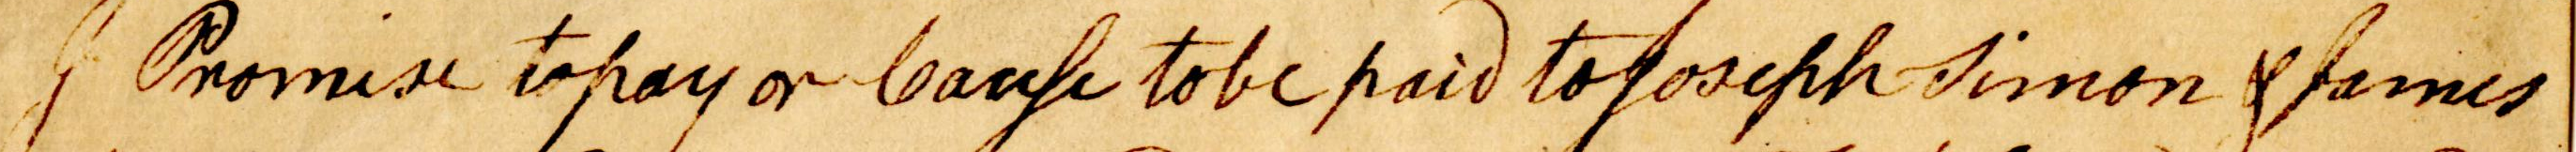I Promise to pay or cause to be paid to Joseph Simon & James
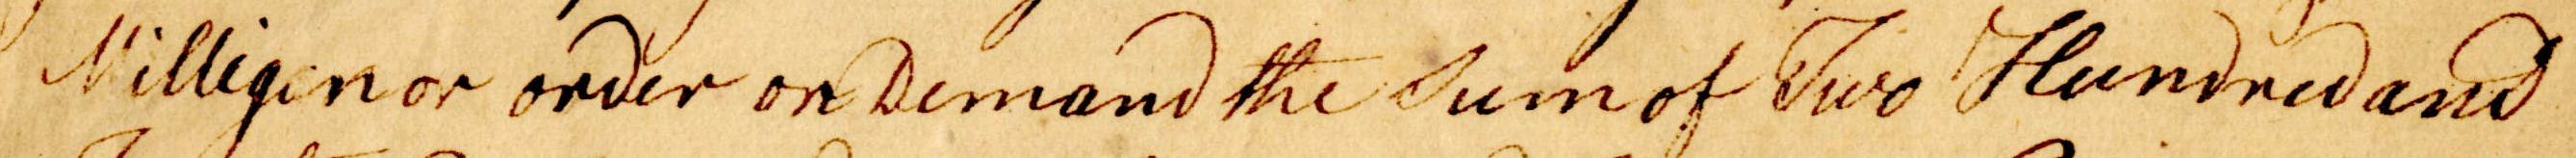Milligan or order on Demand the sum of Two Hundred and
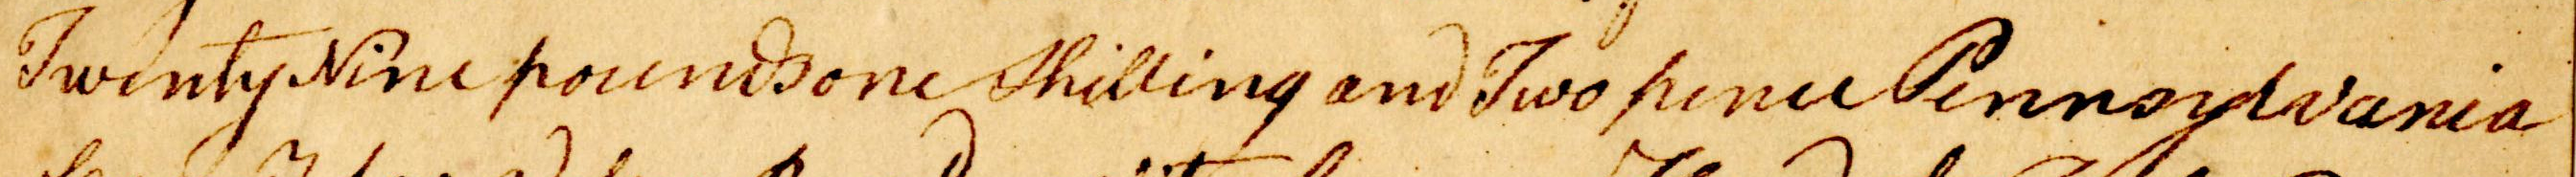Twenty Nine pounds one Shilling and two pence Pennsylvania
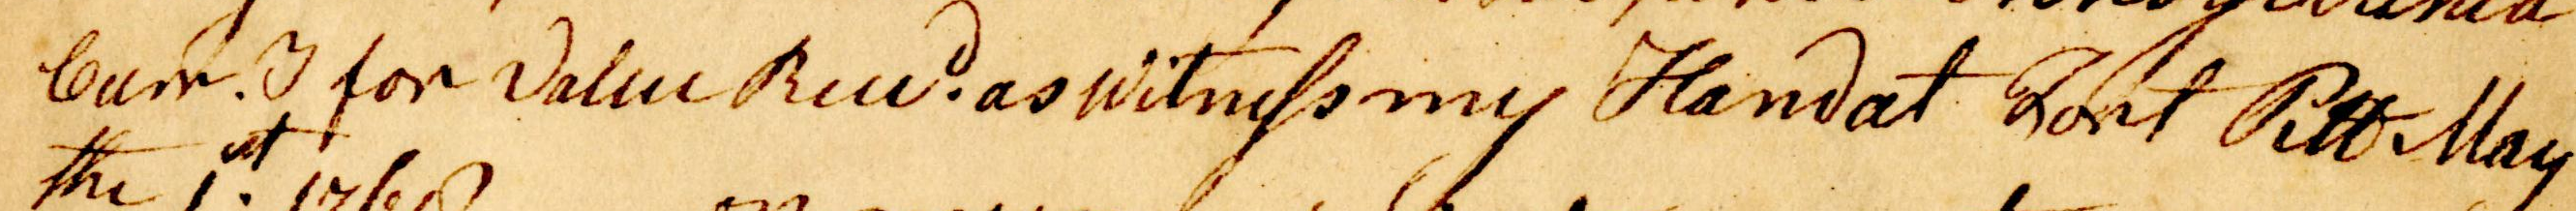Curr^y. for value Rece^d. as witness my Hand at Fort Pitt May
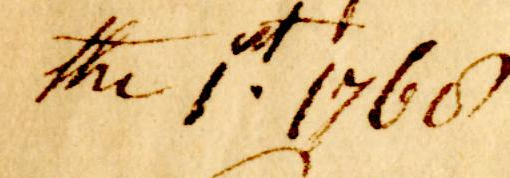the 1^st. 1768
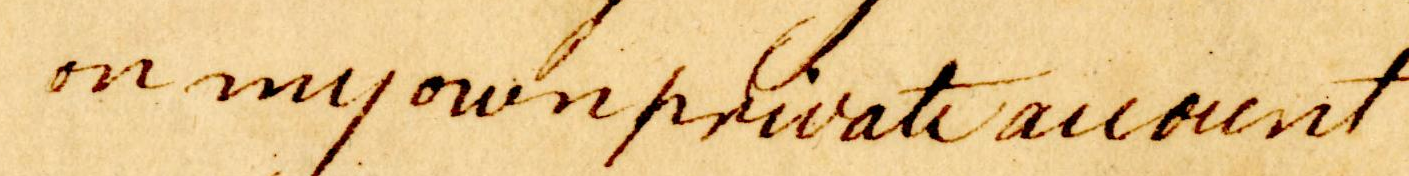on my own private account
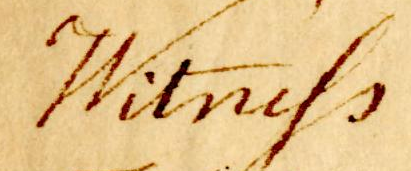Witness
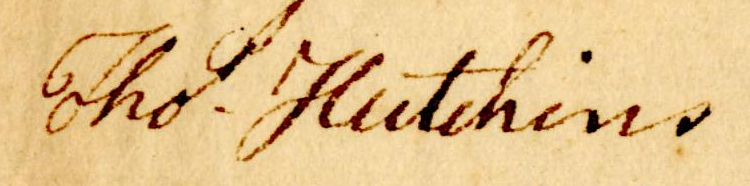Tho^s. Hutchins
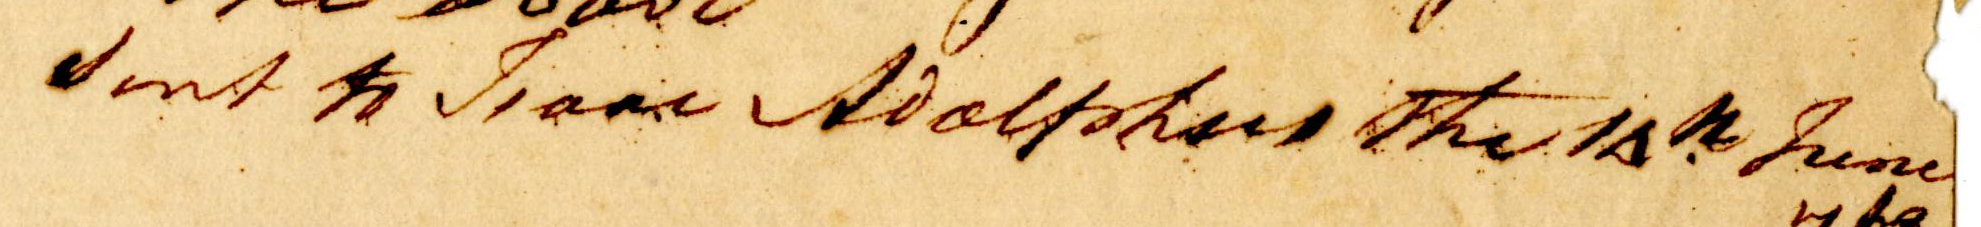sent to Isaac Adolphus the 14^th June
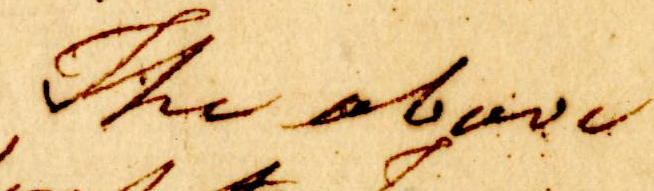The above
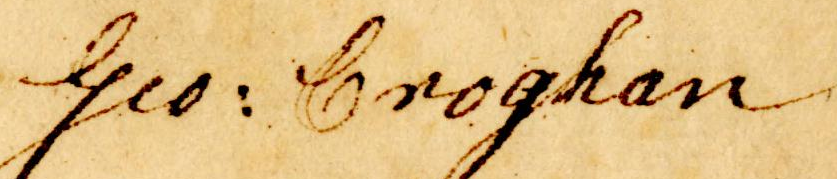Geo: Croghan
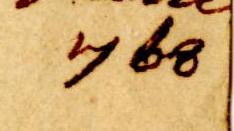768
